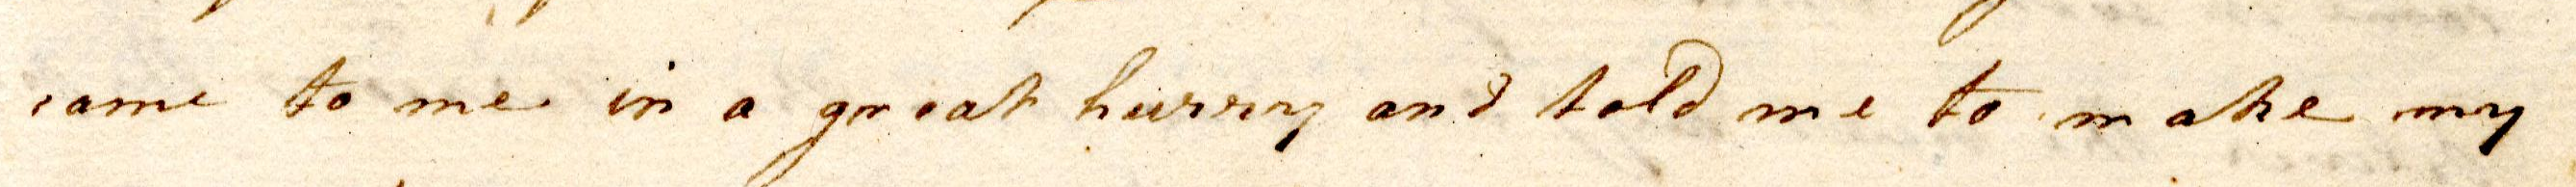came to me in a great hurry and told me to make my
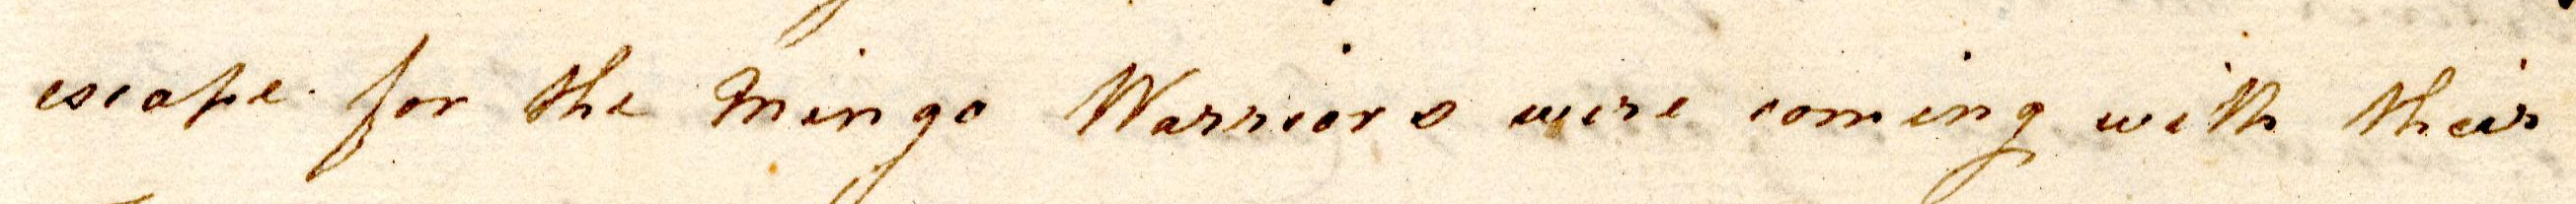escape for the Mingo Warriors were coming with their
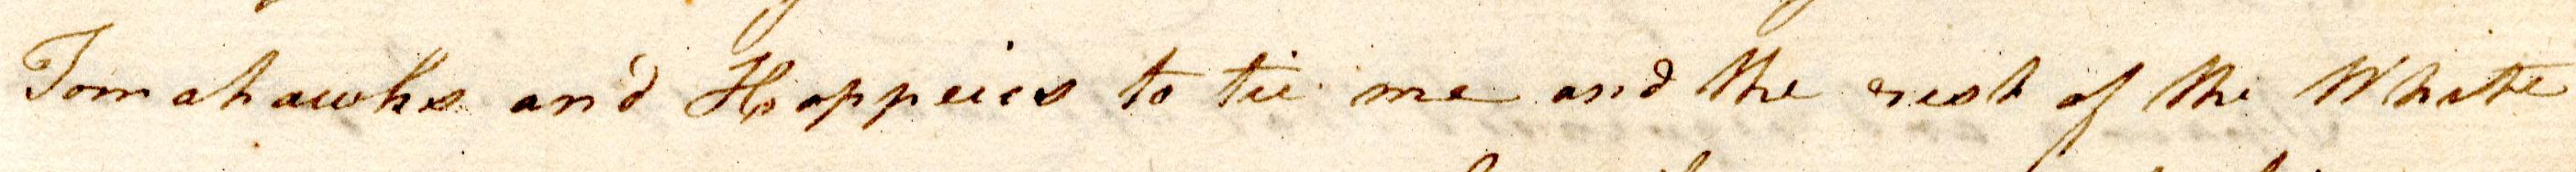Tomahawks and Hoppecies to tie me and the rest of the White
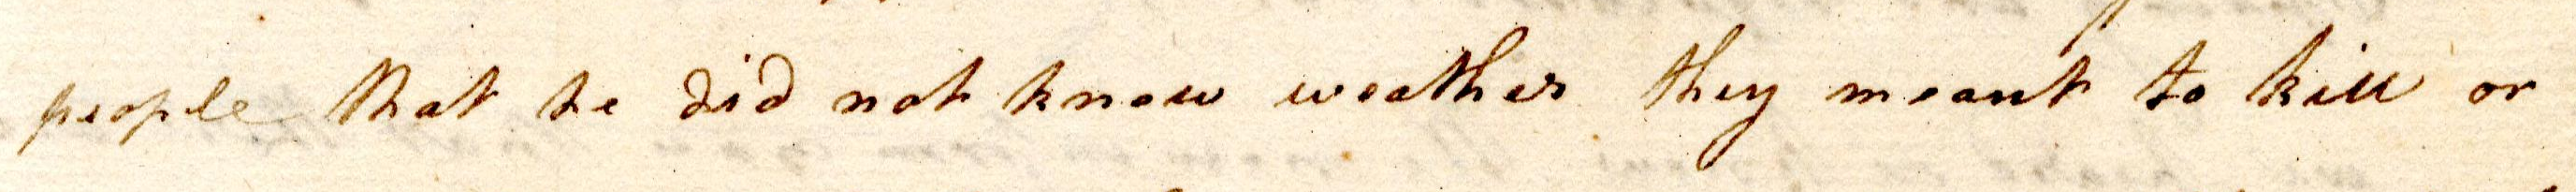people that he did not know weather they meant to kill or
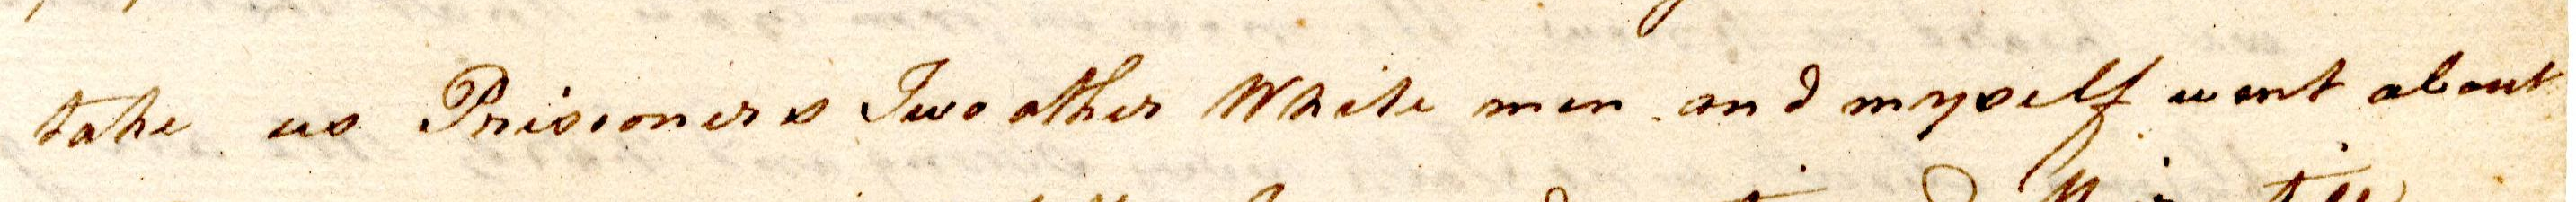take us Prisoners Two other White men and myself went about
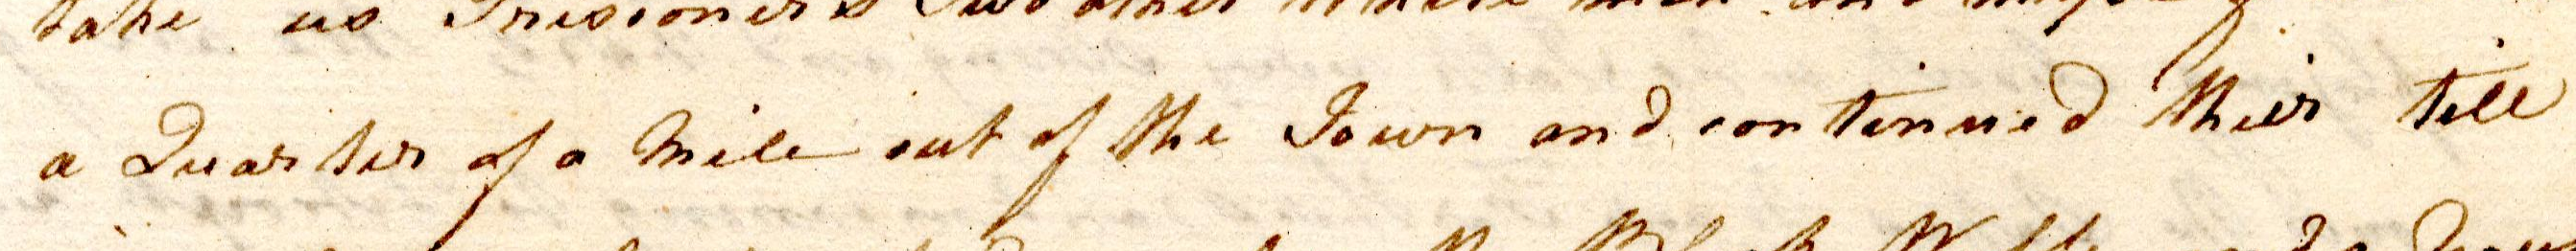a Quarter of a Mile out of the Town and continued their till
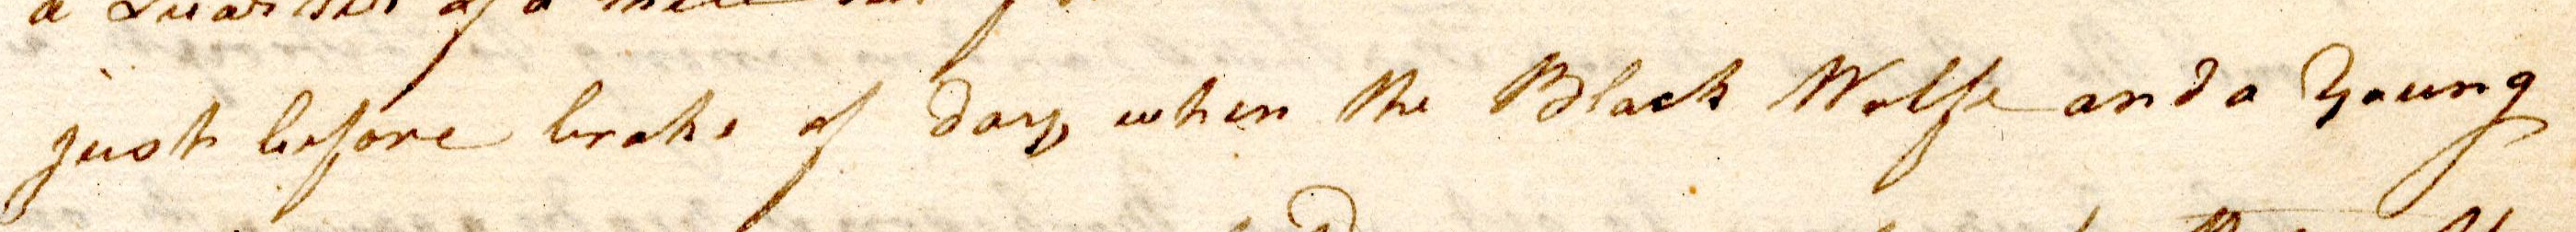just before brake of day, when the Black Wolfe and a Young
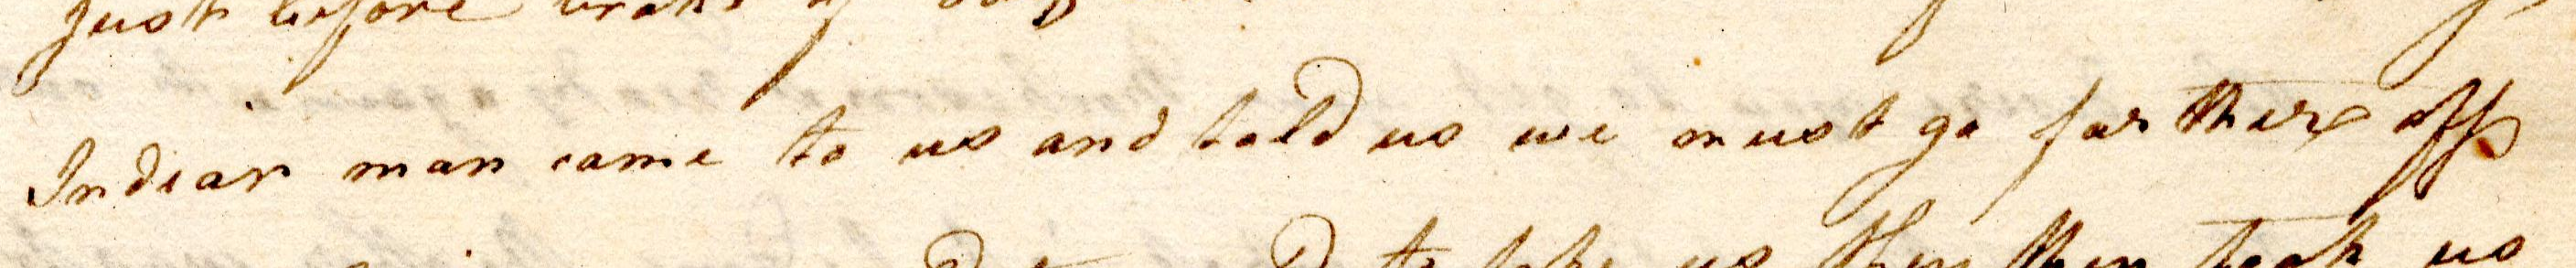Indian man came to us and told us we must go farther off
